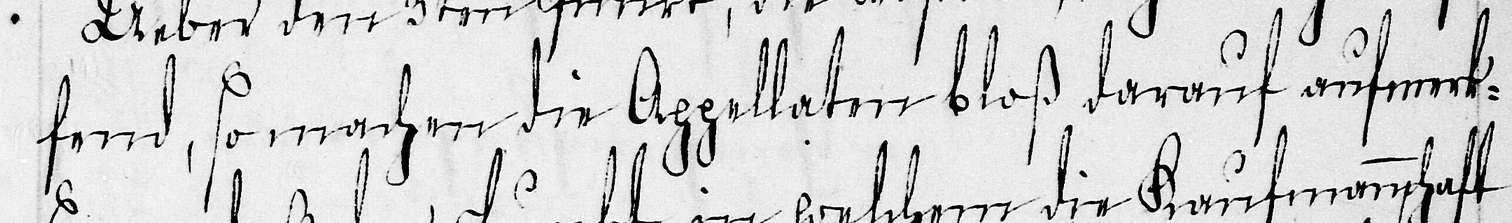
fend, so machen die Appellaten bloß darauf aufmerk¬
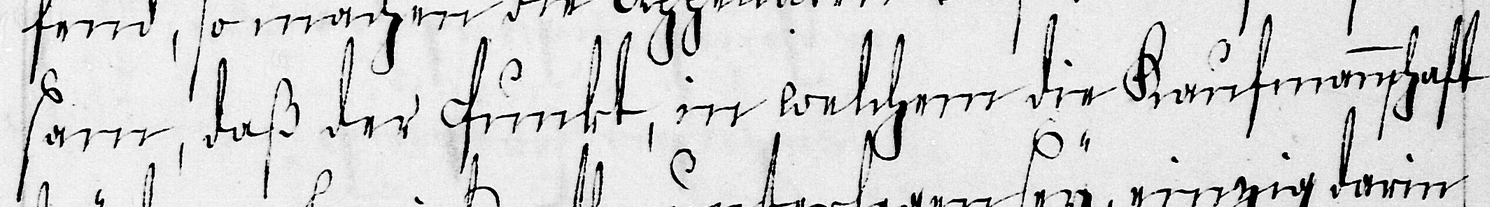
sam, daß der Punkt, in welchem die Kaufmannschaft
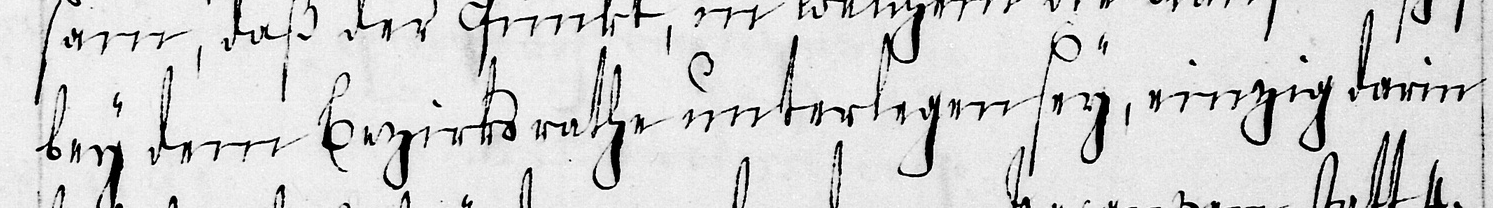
bey dem Bezirksrathe unterlegen sey, einzig darin
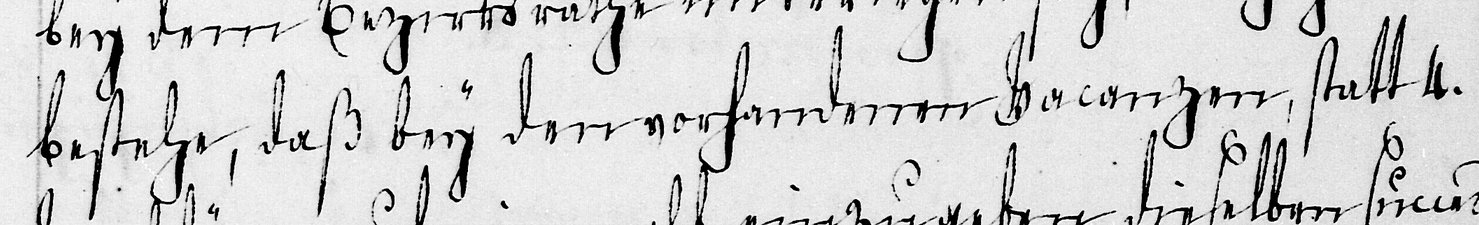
bestehe, daß bey den vorhandenen Vacanzen, statt 4.
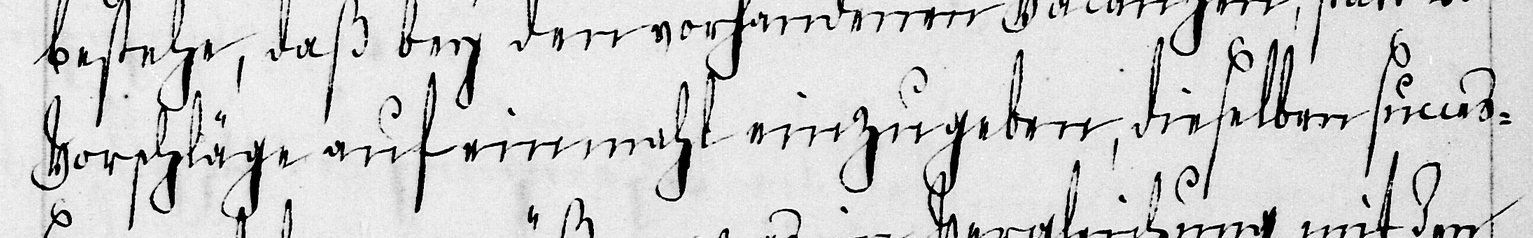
Vorschläge auf einmahl einzugeben, dieselben succe¬
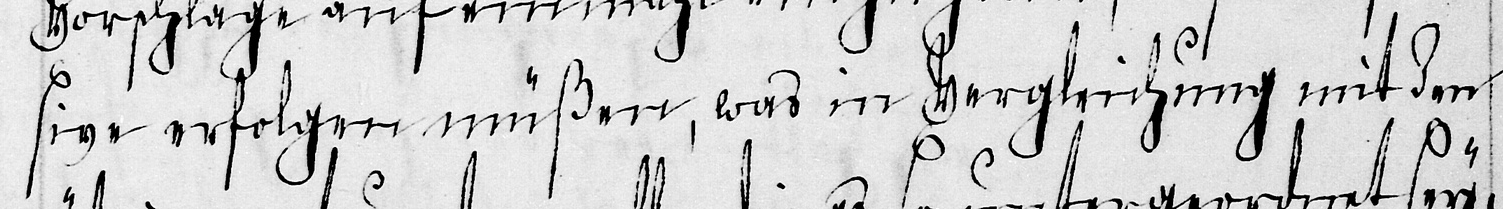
ßive erfolgen müßen, was in Vergleichung mit den
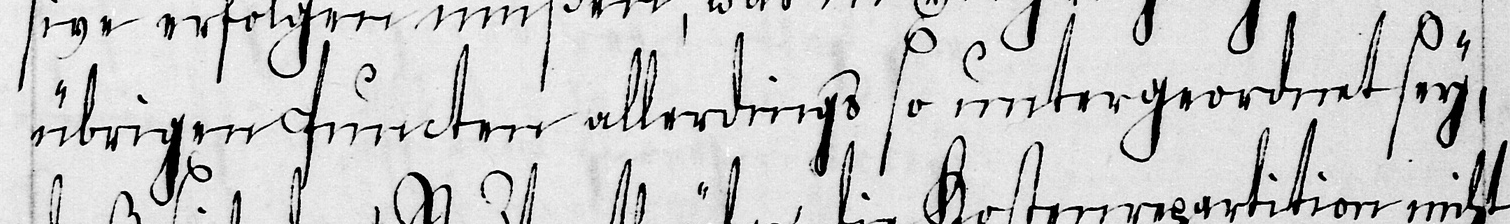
übrigen Puncten allerdings so untergeordnet sey,
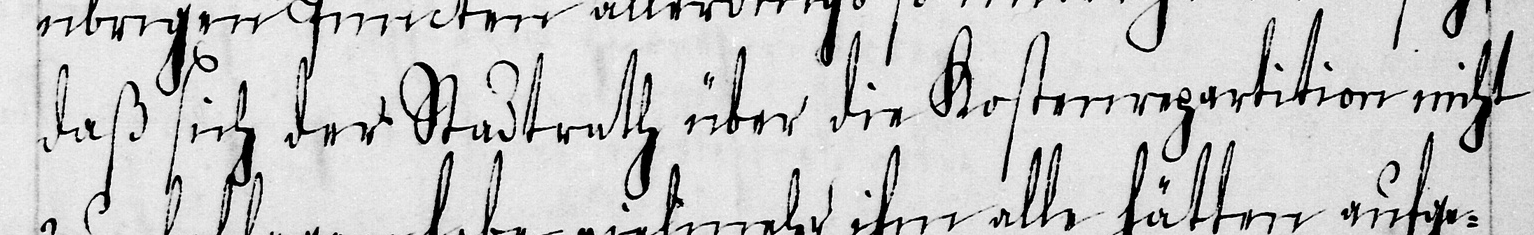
daß sich der Stadtrath über die Kostenrepartition nicht
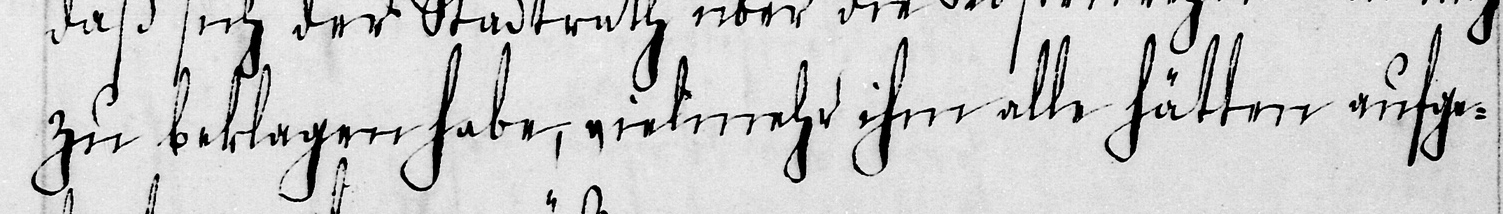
zu beklagen habe, vielmehr ihm alle hätten aufge¬
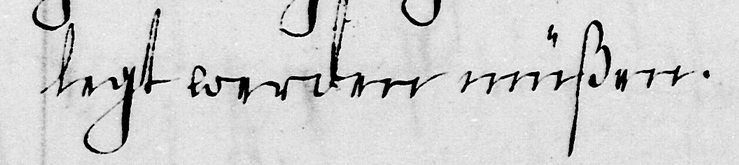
legt werden müßen.
